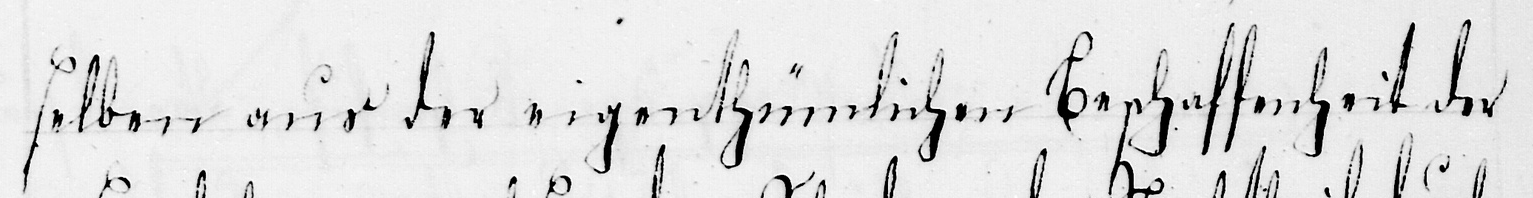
selben aus der eigenthümlichen Beschaffenheit der
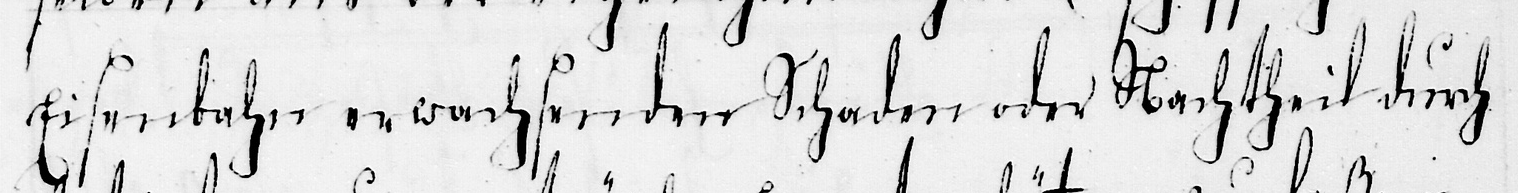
Eisenbahn erwachsenden Schaden oder Nachtheil durch
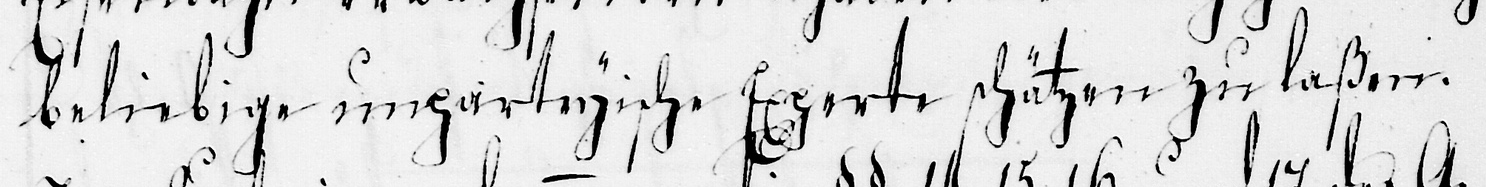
beliebige unparteyische Experte schätzen zu laßen.
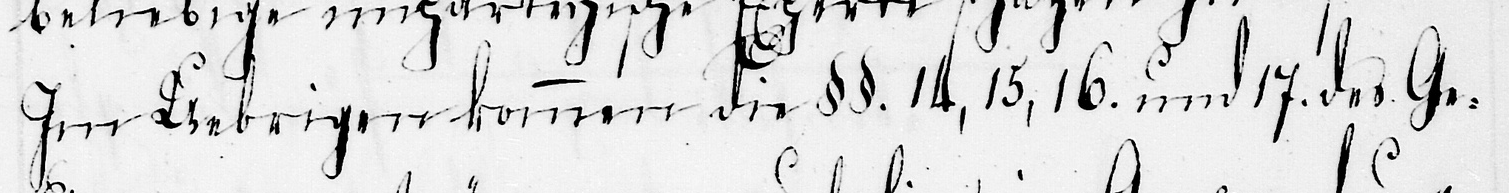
Im Uebrigen kommen die §§. 14, 15, 16. und 17. des Ge¬
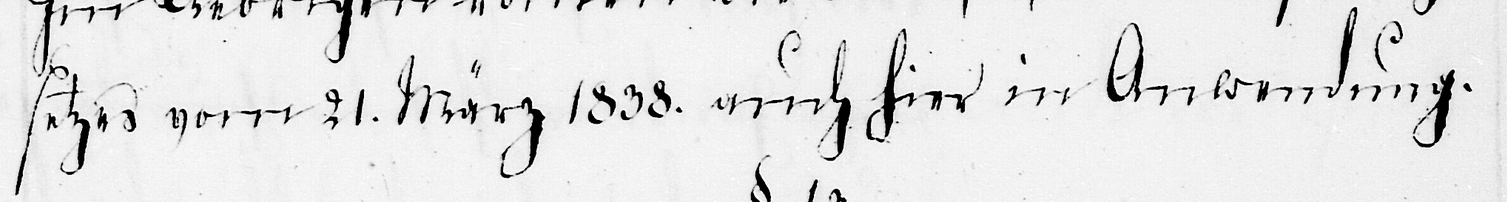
setzes vom 21. März 1838. auch hier in Anwendung.
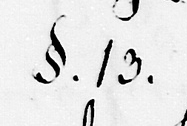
§. 13.
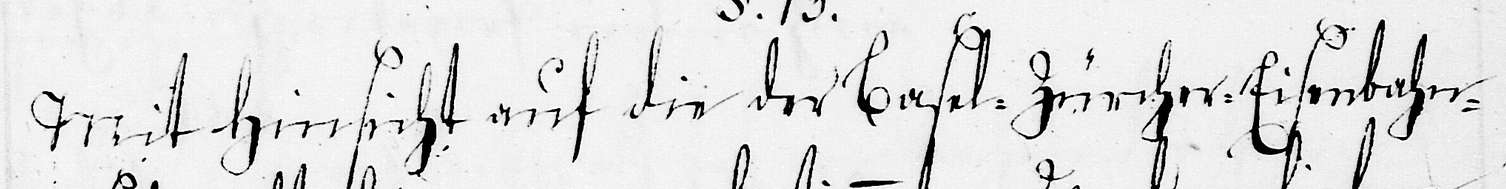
Mit Hinsicht auf die der Basel-Zürcher-Eisenbah¬
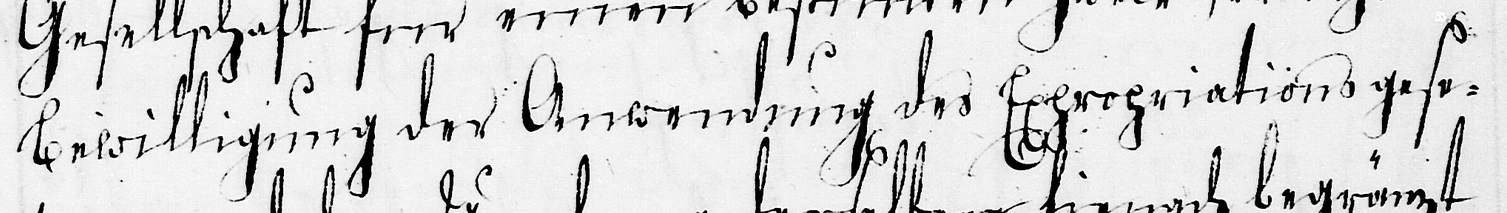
Bewilligung der Anwendung des Expropriationsgese¬
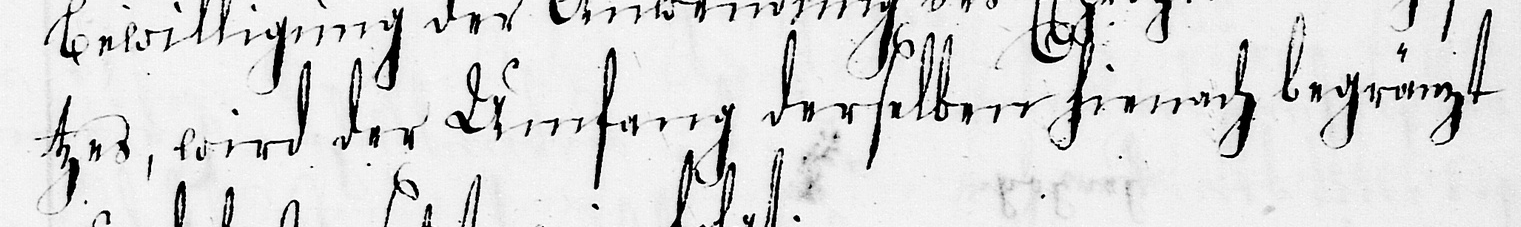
tzes, wird der Umfang derselben hienach begränzt
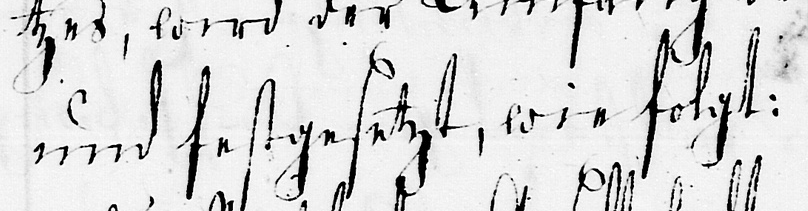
und festgesetzt, wie folgt:
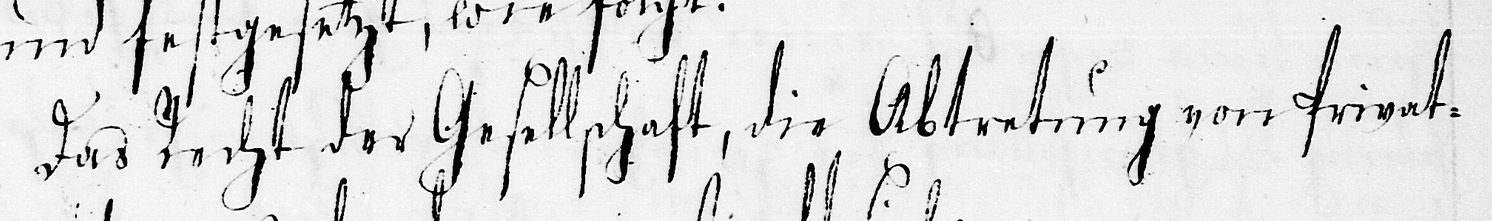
Das Recht der Gesellschaft, die Abtretung von Privat¬
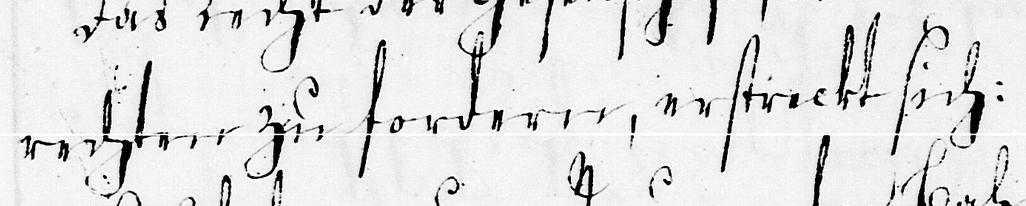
rechten zu fordern, erstreckt sic¬
